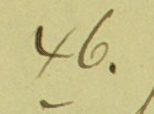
46
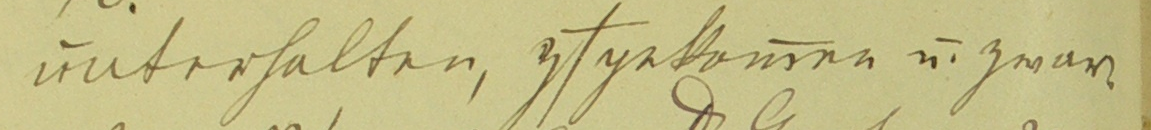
..unterhalten, zusammengekommen und zwar:
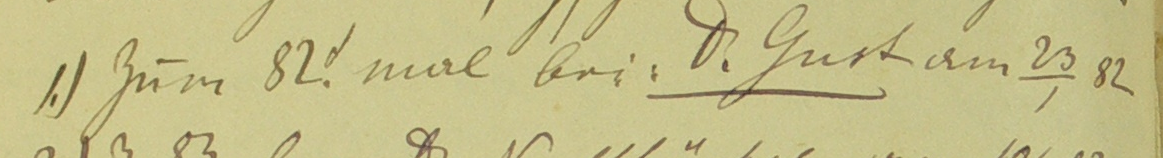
1.) Zum 82. mal bei: Dr. Gust am 23/1 82
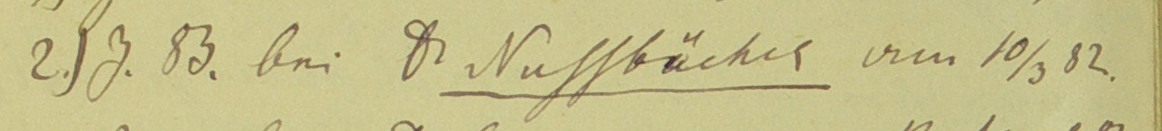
2.) * 83. bei Dr. Nussbächer am 10/3 82
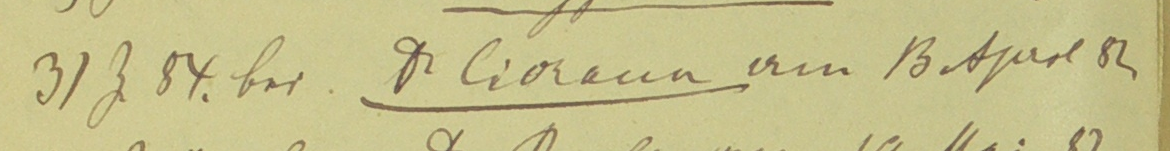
3.) * 84. bei Dr. Cioranu am 13 April 82
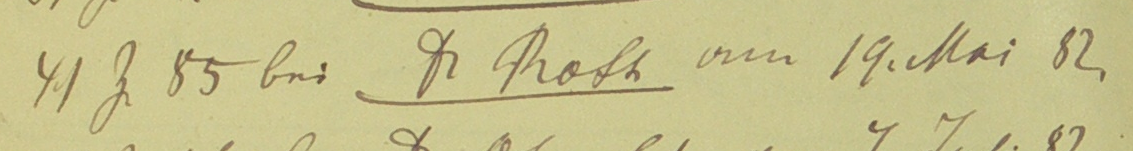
4.) * 85. bei Dr. Roth am 19 Mai 82
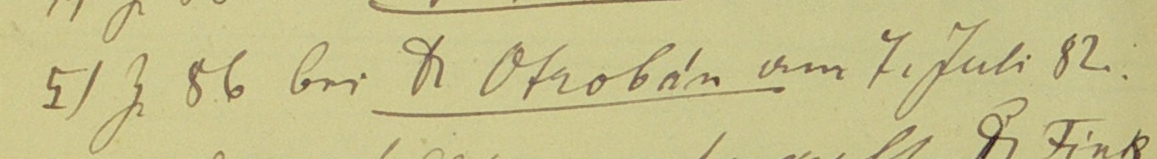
5.) * 86. bei Dr. Otroban am 7 Juli 82
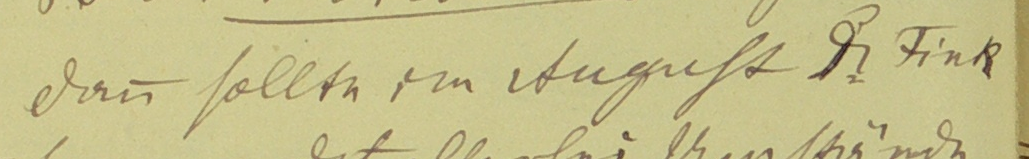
Dann sollte im August Dr. Fink
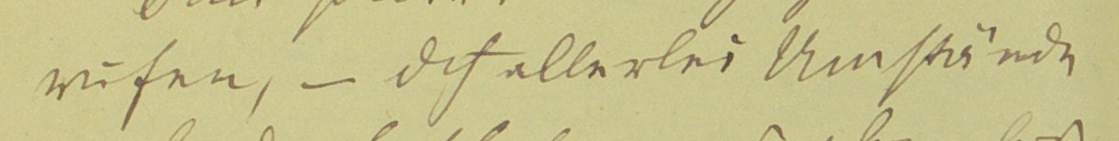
rufen.—durch allerlei Umstände
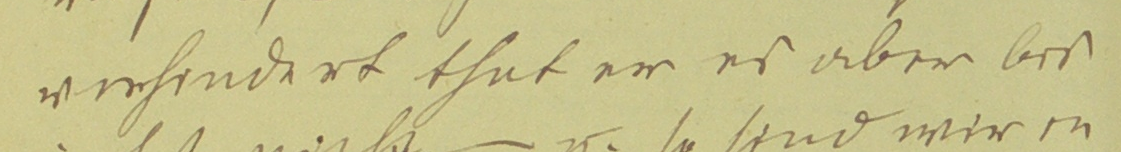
verhindert that er es aber bis
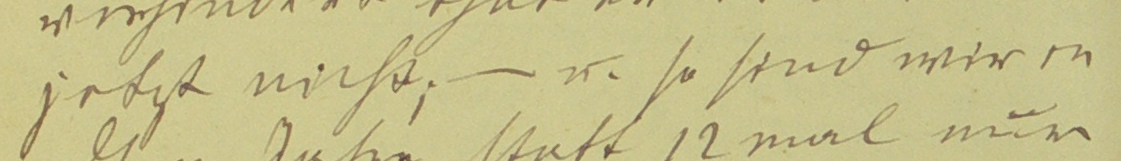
jetzt nicht;--und so sind wir in
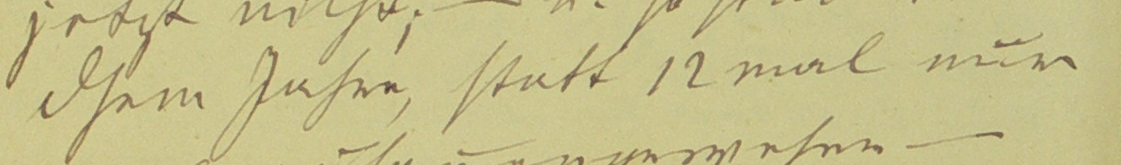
diesem Jahr statt 12 mal nur
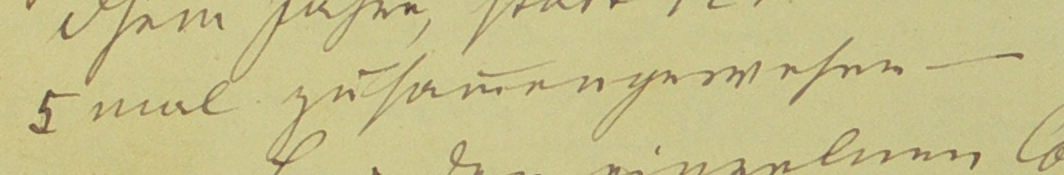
5 mal zusammengekommen.
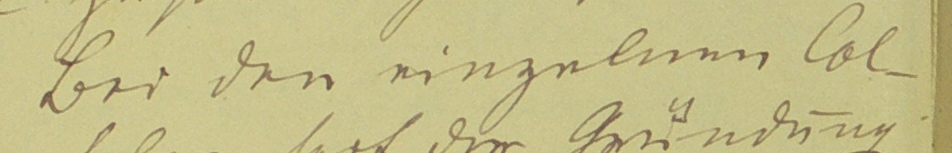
Bei den einzelnen Col¬
